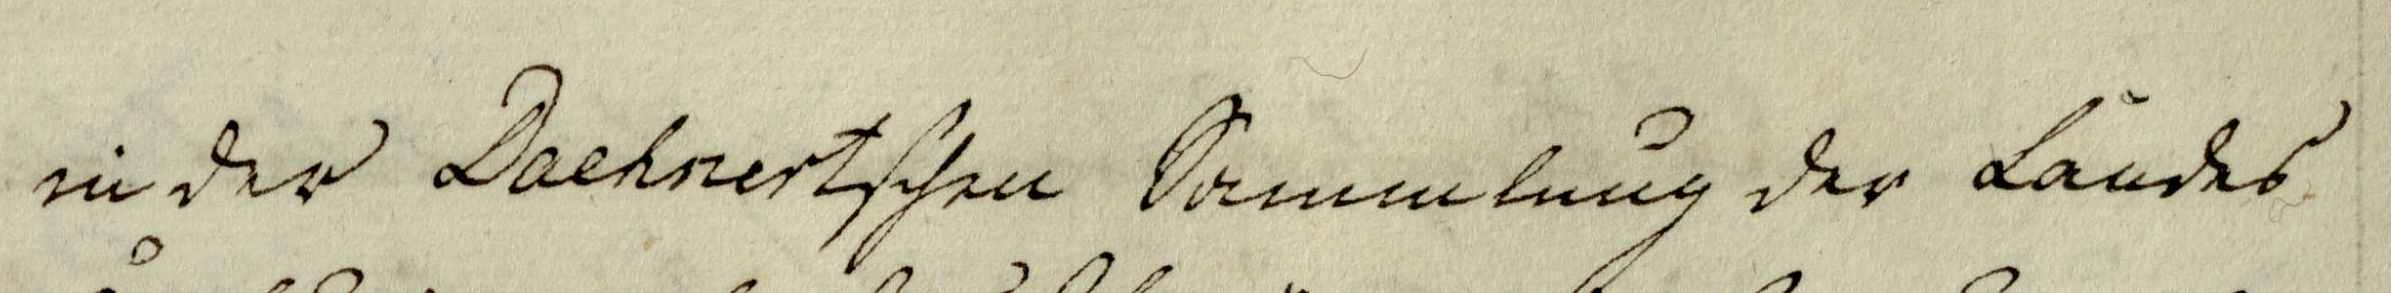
in der Daehnertschen Sammlung der Landes
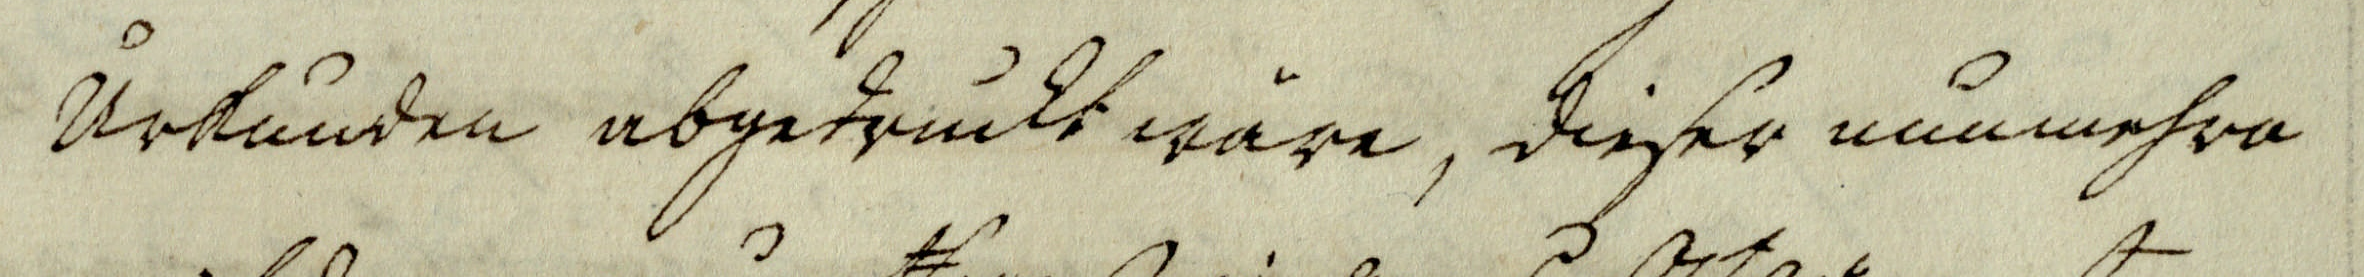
Urkunden abgedruckt wäre, dieser nunmehro
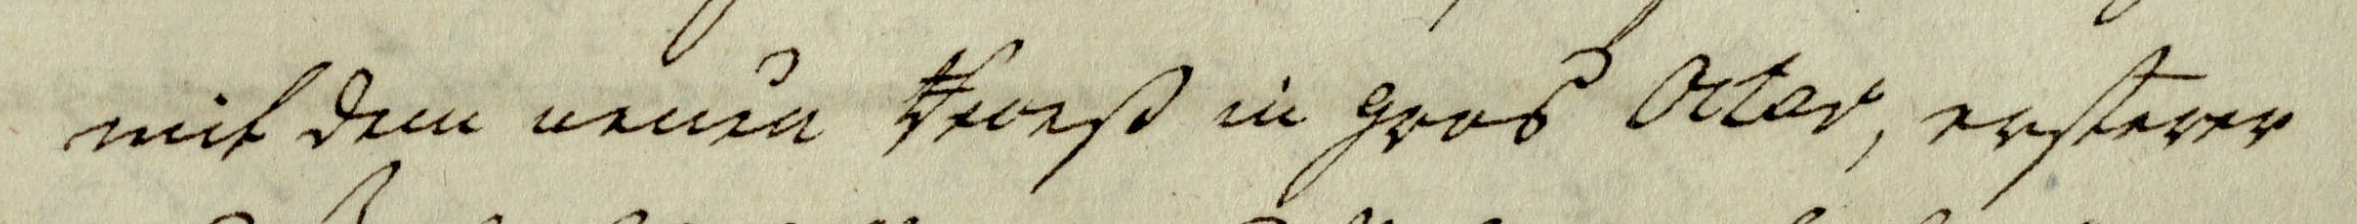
mit dem neuen Receß in gros Octav, ersterer
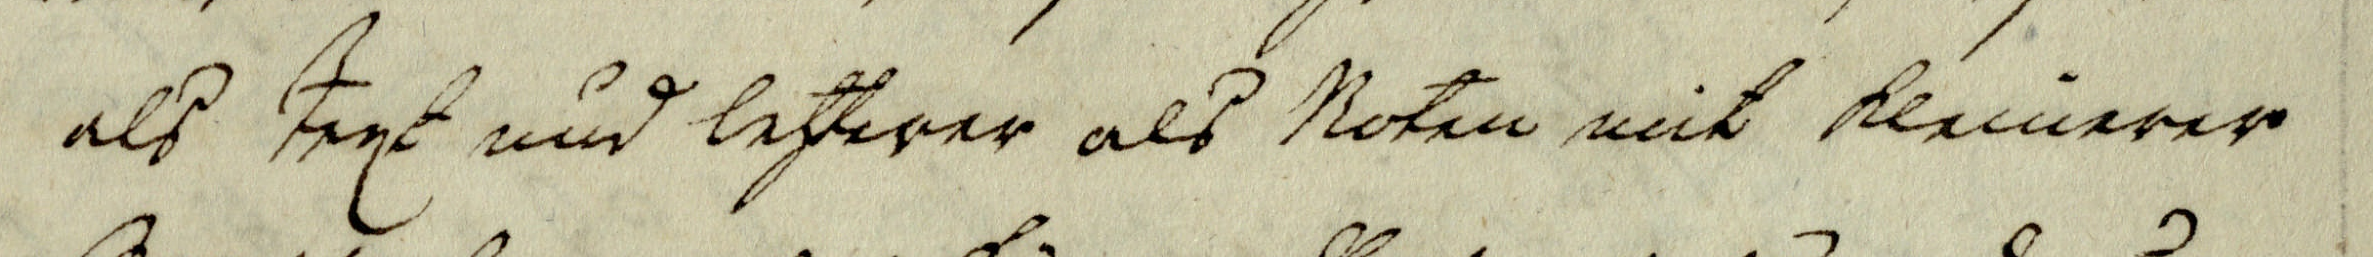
als Text und letzterer als Noten mit kleinerer
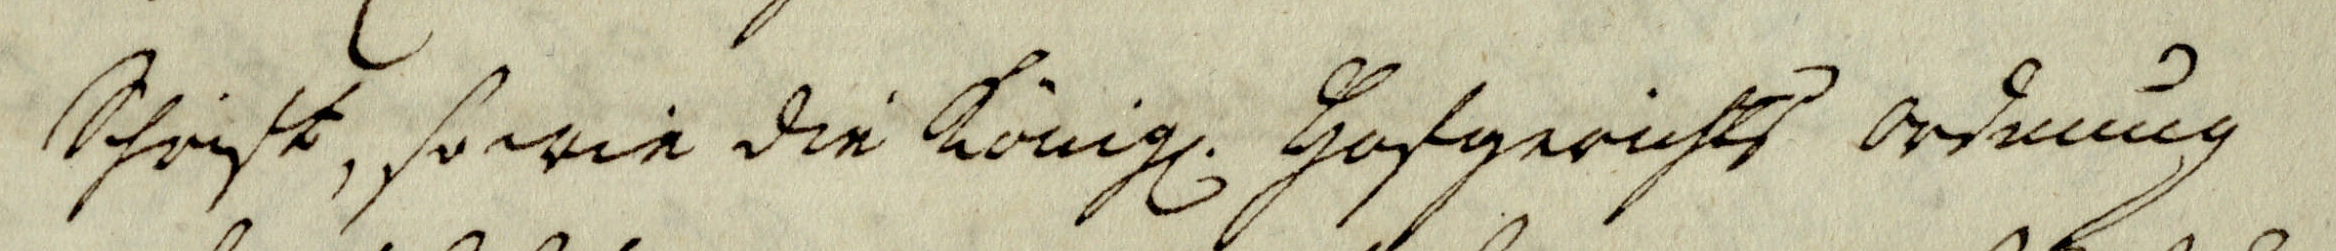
Schrift, so wie die Königl. Hofgerichts Ordnung
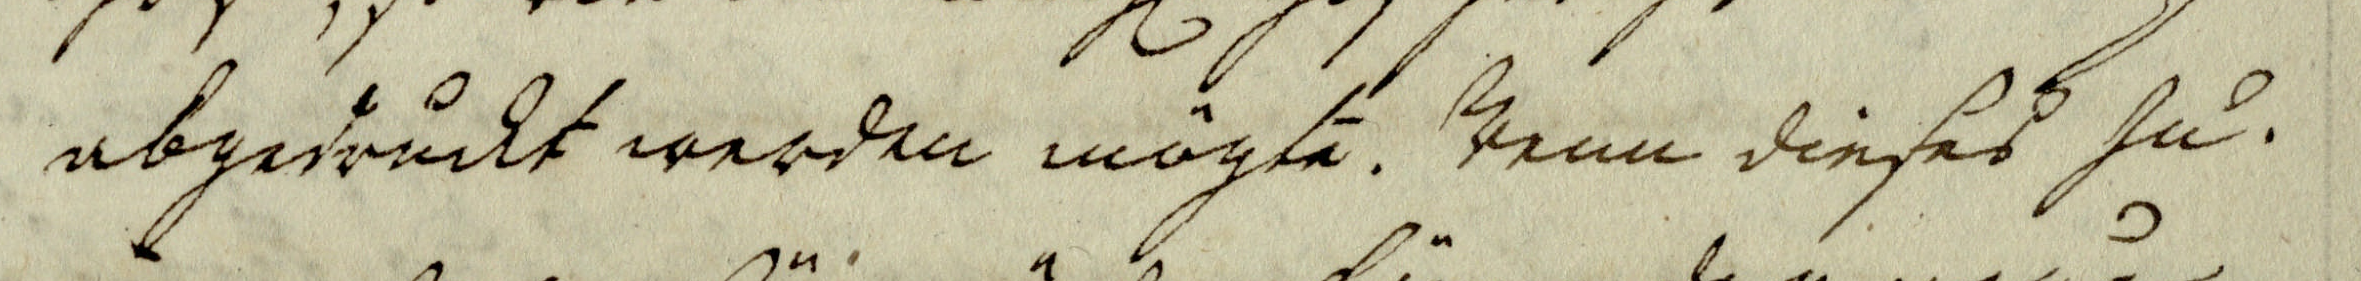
abgedruckt werden mögte. Wenn dieses zu¬
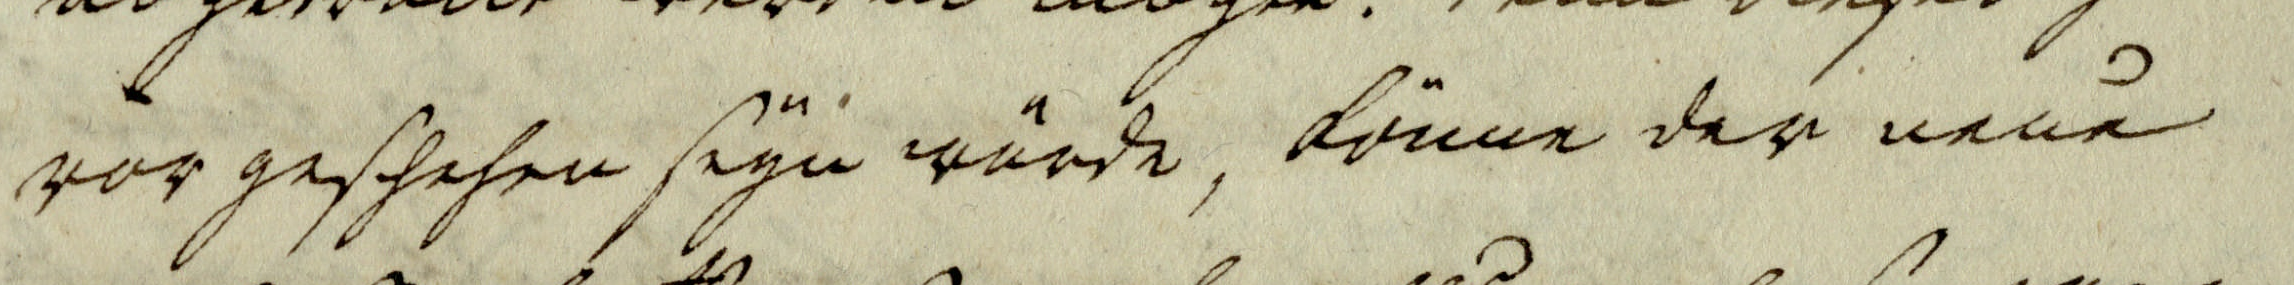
vor geschehen seÿn würde, könne der neue
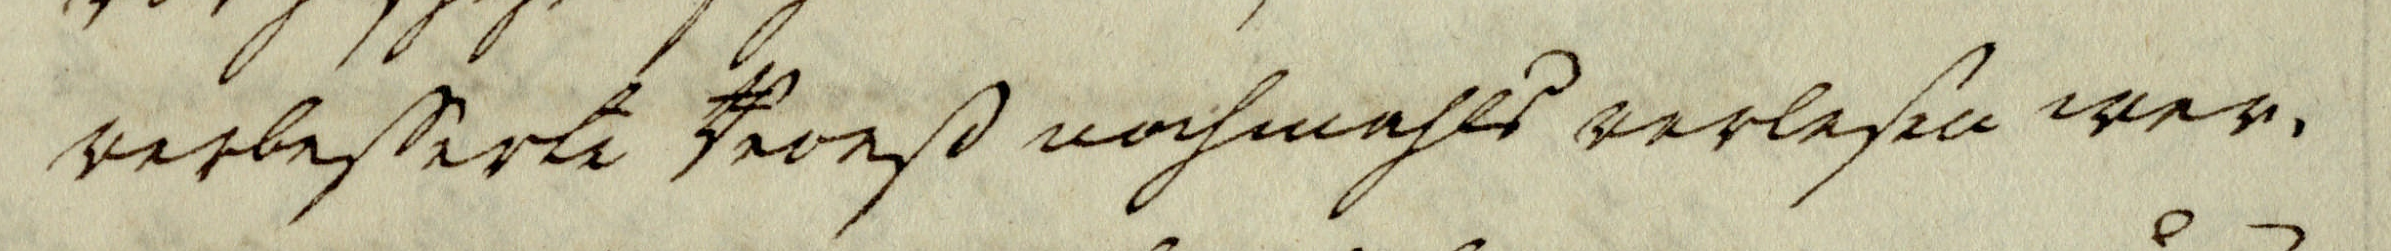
verbesserte Receß nochmahls verlesen wer¬
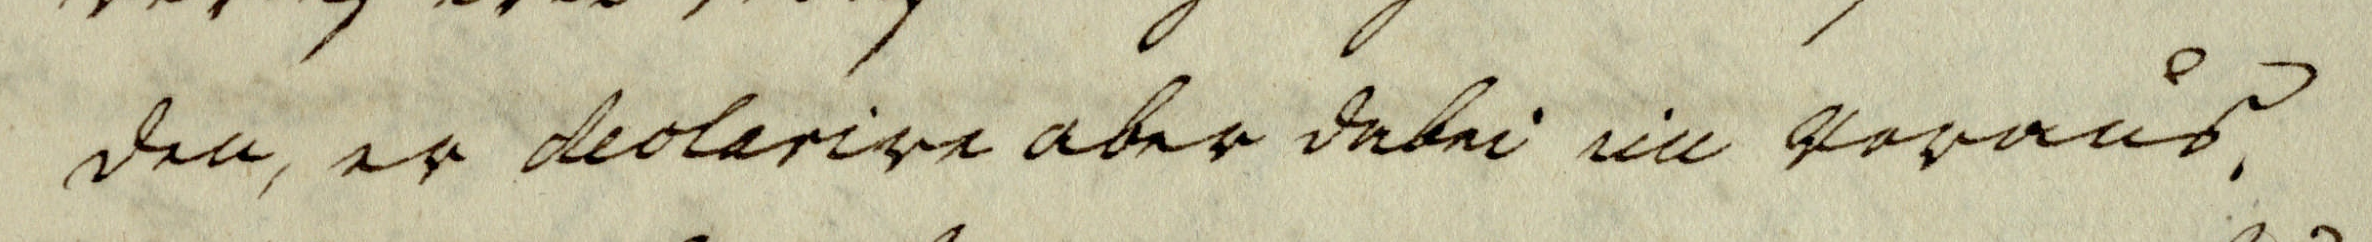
den, er declarire aber dabei im voraus,
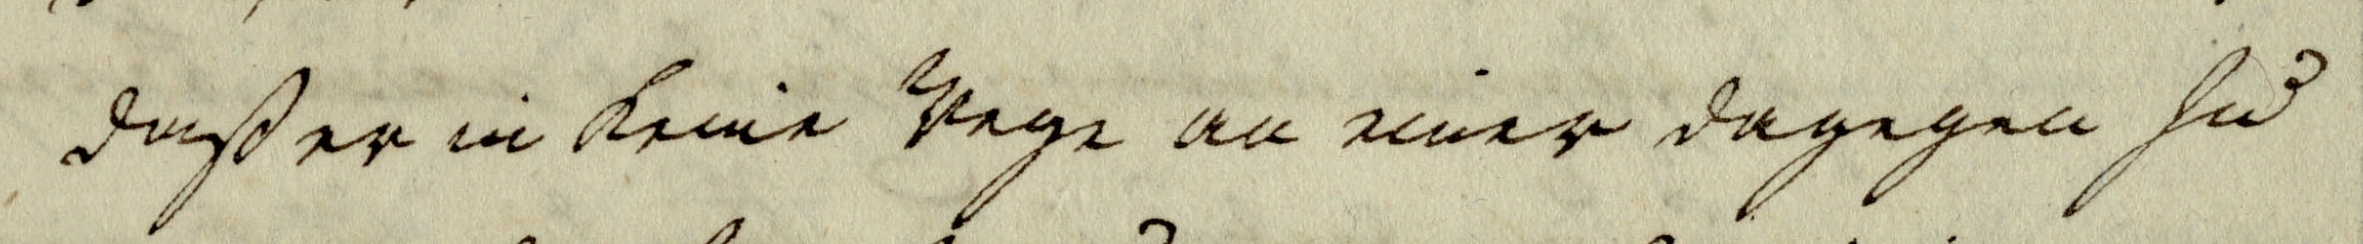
daß er in keine Wege an einer dagegen zu
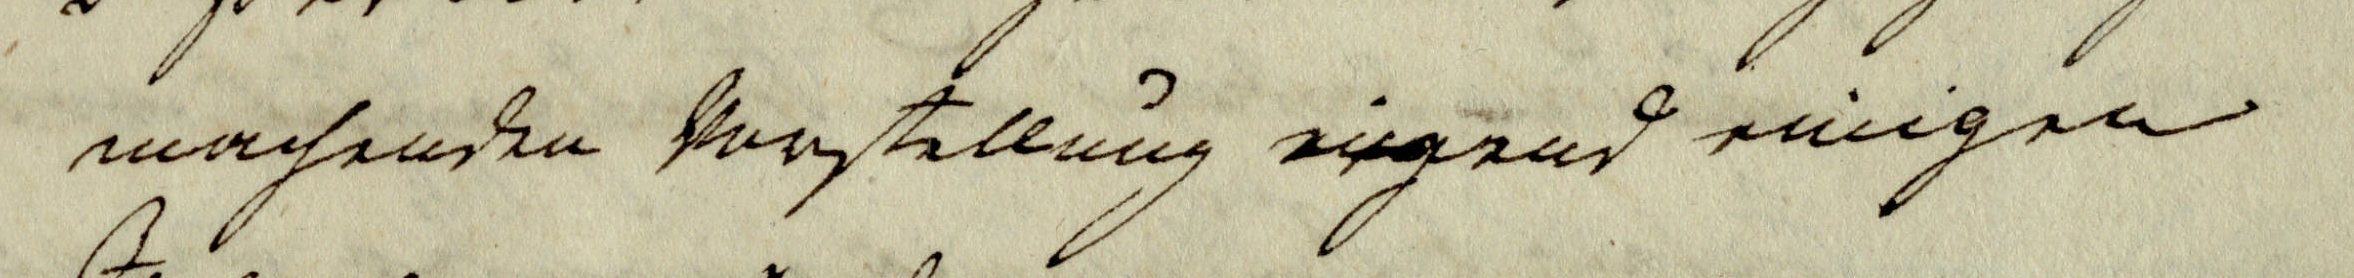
machenden Vorstellung irgend einigen
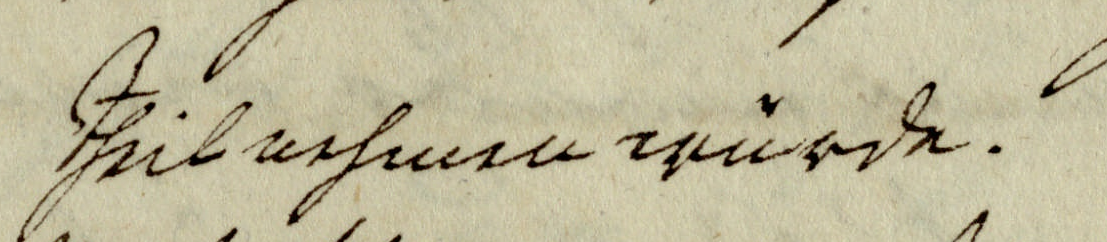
Theil nehmen würde.
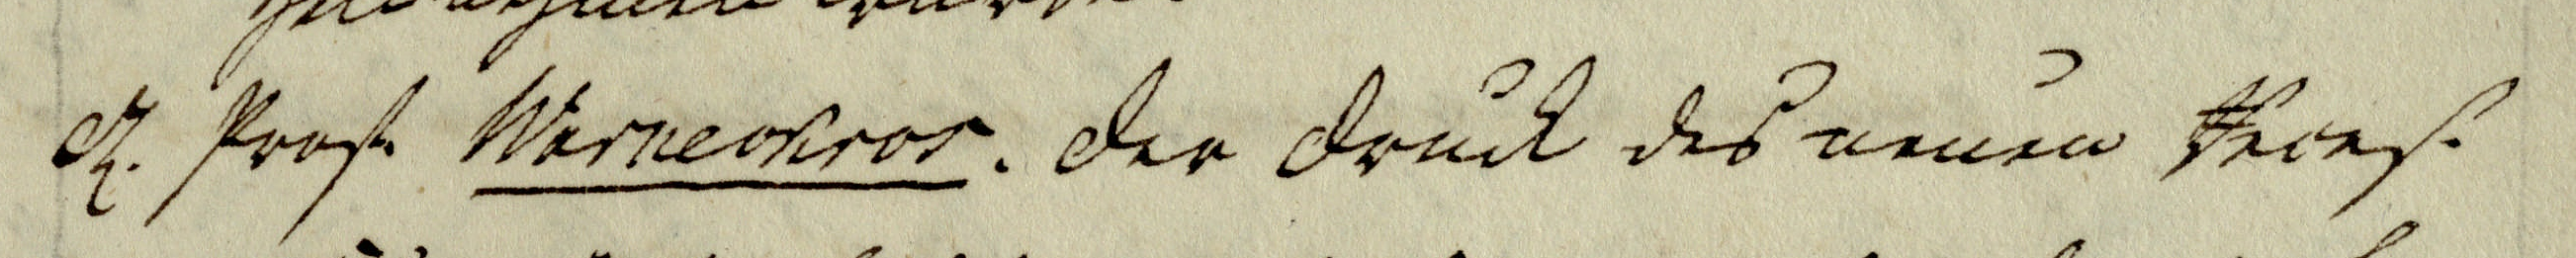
dh. Prof. Warneckros. Der Druck des neuen Reces¬
